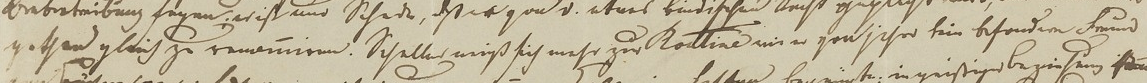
gethan gleich zu renommiren. Schaller neigt sich mehr zur Routine wie er von jeher kein besondrer Freund
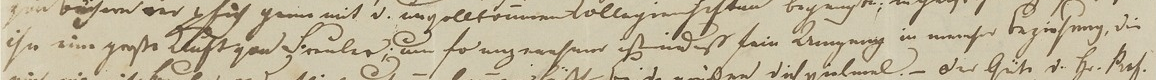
ihn eine große Kluft von Freuler; um so angenehmer ist indess sein Umgang in mancher Beziehung, die
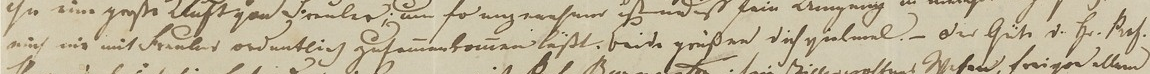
mich nie mit Freuler ordentlich zusammenkommen läßt. Beide grüßen dich vielmal. – Der Güte d. Hr. Prof.
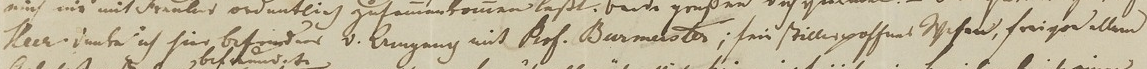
Heer danke ich hier besonders d. Umgang mit Prof. Burmeister ; sein stilles & offnes Wesen, frei von allem
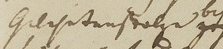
Gelehrtenstolze zogbefreundete
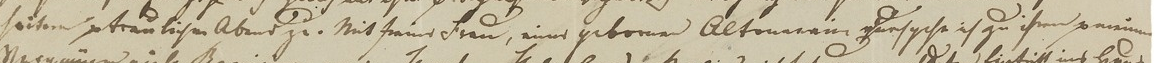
heitern & traulichen Abend zu. Mit seiner Frau, einer gebornen Altonaerin durchgehe ich zu ihrem & meinem
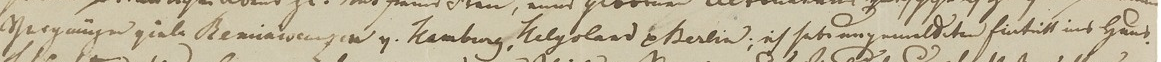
Vergnügen viele Reminiscenzen v. Hamburg, Helgoland & Berlin; ich habe ungemeldeten Eintritt ins Haus.
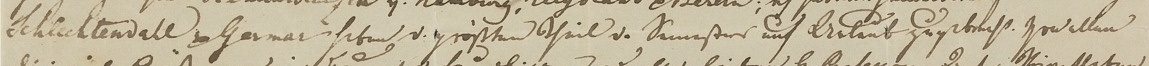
Schlechtendahl & Germar haben d. größten Theil d. Semesters auf Urlaub zugebracht. Von allen
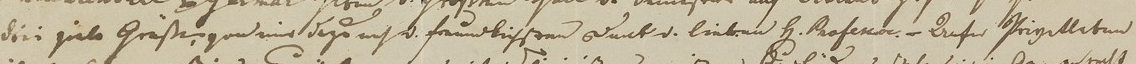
drei viele Grüße, von mir dazu auch d. freundlichsten Dank d. lieben H. Professor. – Unser Privatleben
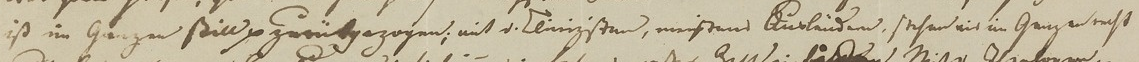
ist im Ganzen still & zurükgezogen; mit d. Clinizisten, meistens Ausländern, stehen wir im Ganzen recht
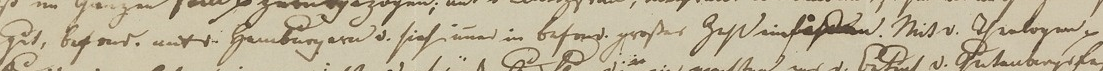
gut, besond. mit d. Hamburgern d. sich immer in besond. großer Zahl einfinden. Mit d. Theologen &
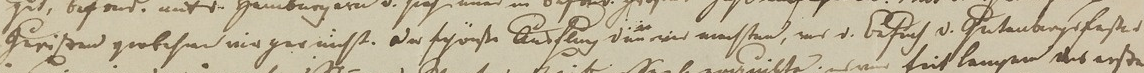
Juristen verkehren wir gar nicht. Der schönste Ausflug den wir machten, war d. Besuch d. Gutenbergsfestes
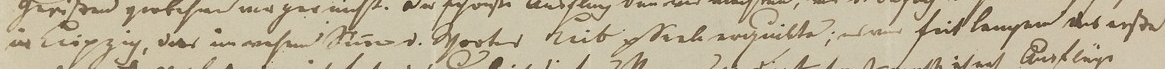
in Leipzig, das im wahren Sinne d. Wortes Leib & Seele erquikte; es war seit langem das erste
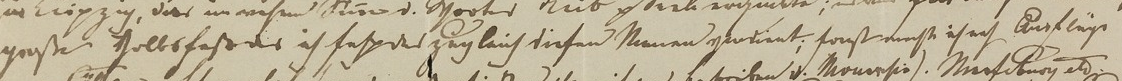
große Volksfest das ich sah & das zugleich diesen Namen verdient; sonst machte ich noch Ausflüge
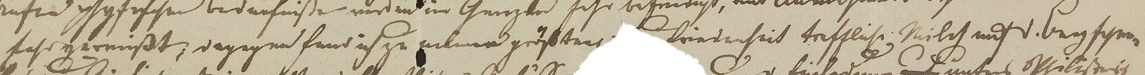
sehr vermißt; dagegen fand ich zu meiner größten Zufriedenheit treffliche Milch auf d. Bergschen-
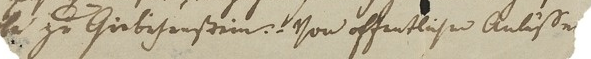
ke zu Giebichenstein. Von öffentlichen Anlässen
